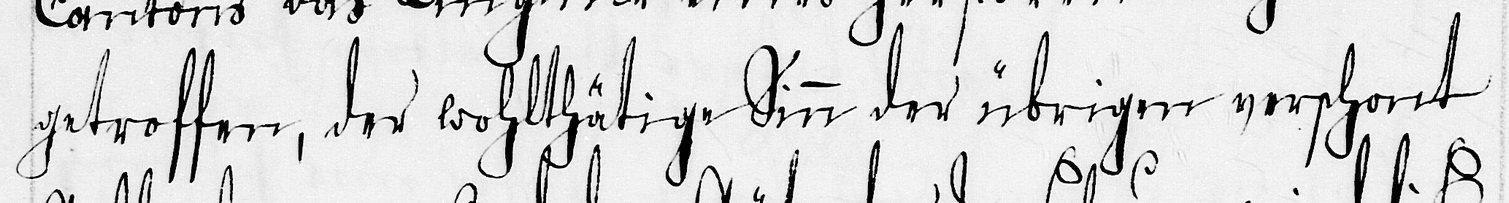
getroffen, der wohlthätige Sinn der übrigen verschont
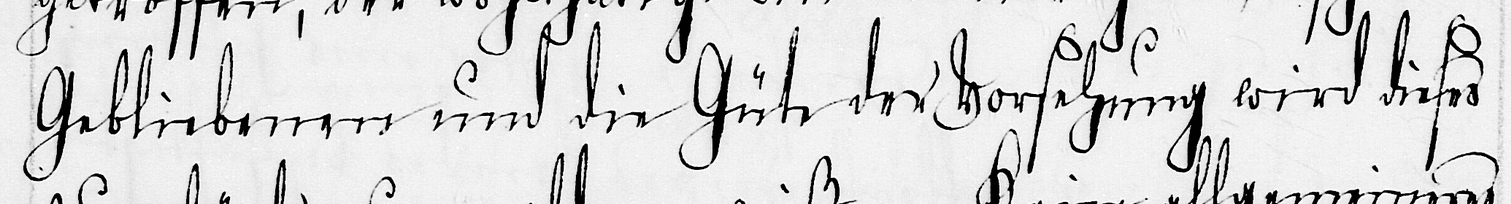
Gebliebenen und die Güte der Vorsehung wird dieses
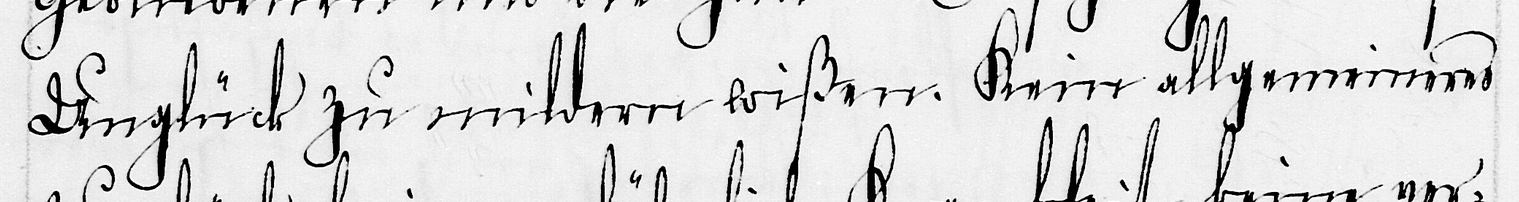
Unglück zu mildern wißen. Kein allgemeineres
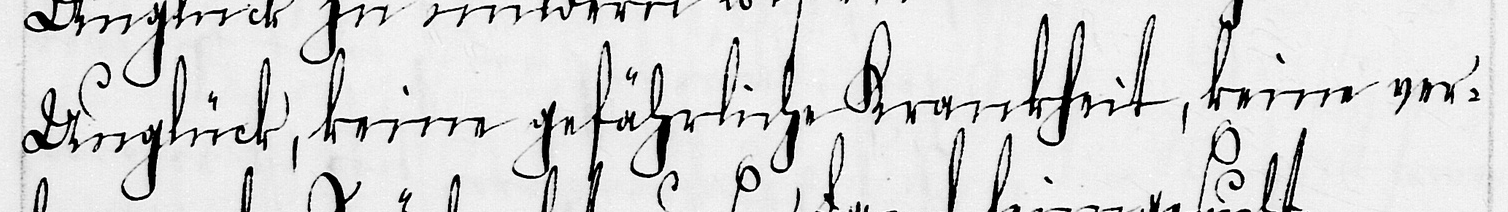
Unglück, keine gefährliche Krankheit, keine ver¬
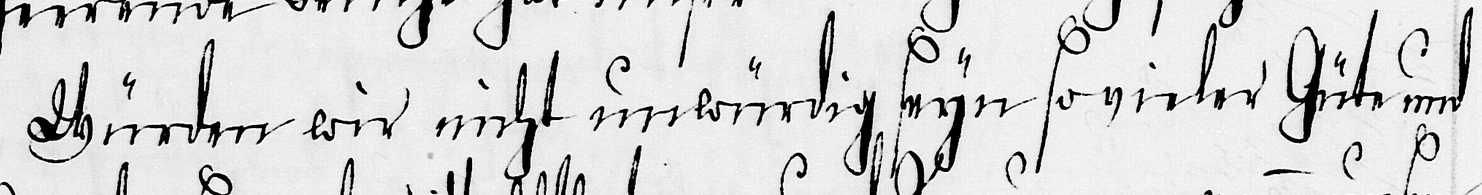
Würden wir nicht unwürdig seyn so vieler Güte und
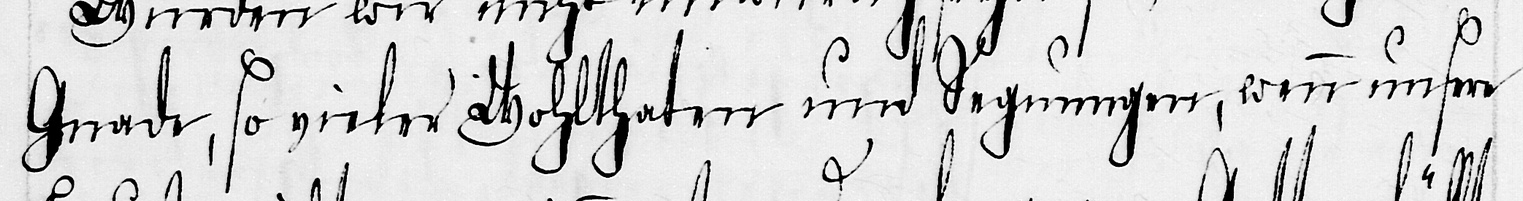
Gnade, so vieler Wohlthaten und Segnungen, wenn unsere
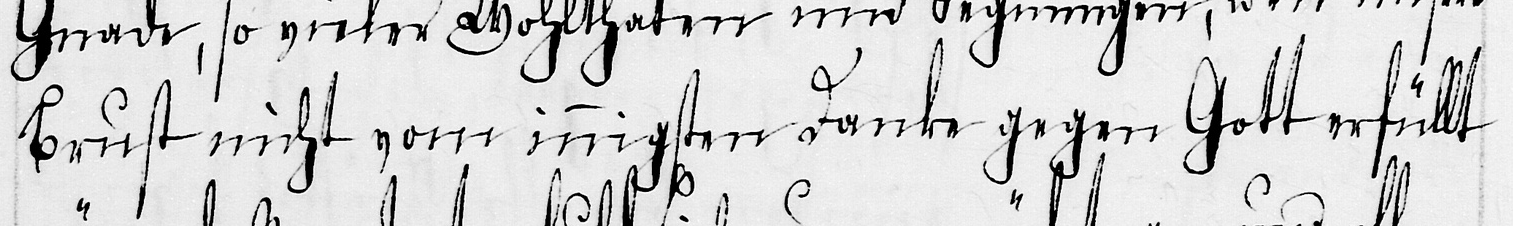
Brust nicht vom innigsten Danke gegen Gott erfüllt
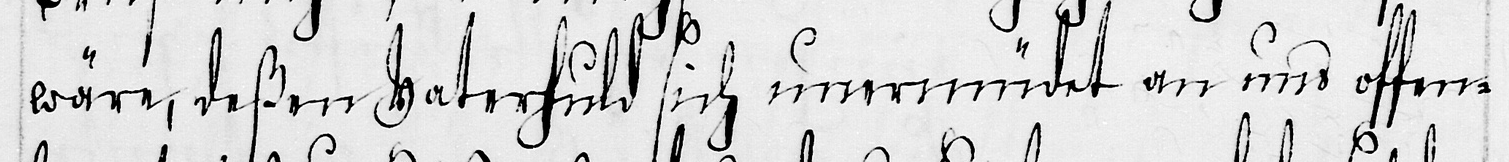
wäre, deßen Vaterhuld sich unermüdet an uns offen¬
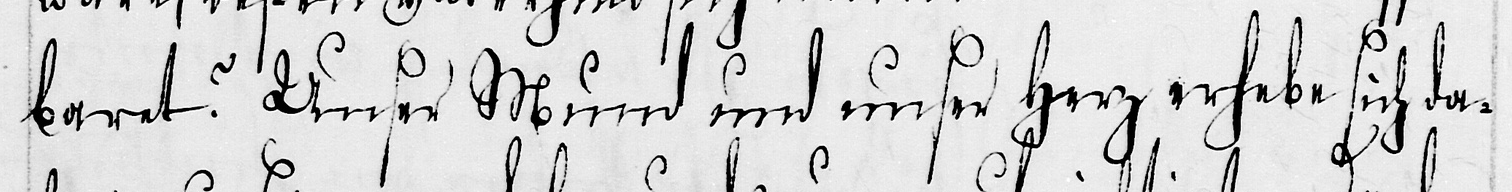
baret? Unser Mund und unser Herz erhebe sich da¬
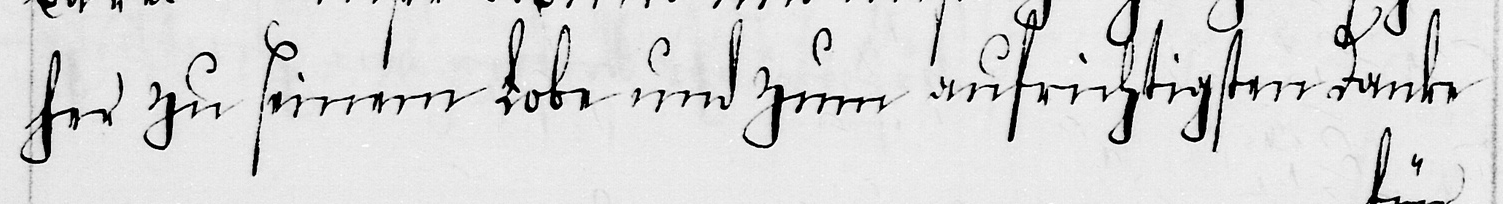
her zu seinem Lobe und zum aufrichtigsten Danke
